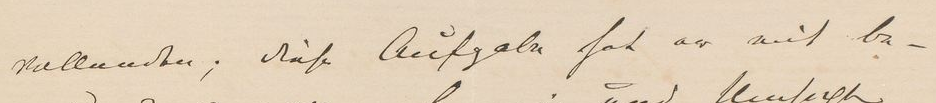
vollenden; diese Aufgabe hat er mit be-
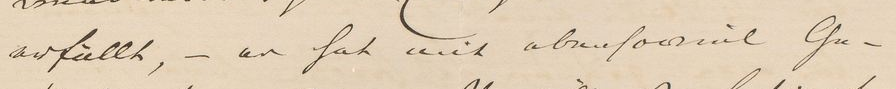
erfüllt, – er hat mit ebensoviel Ge-
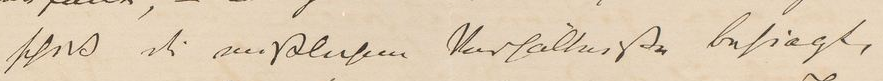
schick die mißlichen Verhältniße besiegt,
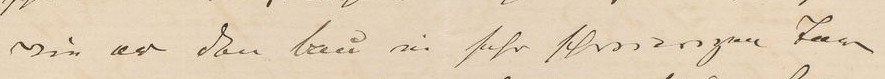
wie er den Bau in sehr schwierigem Ter-
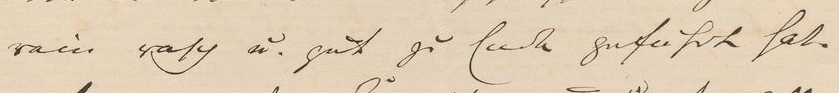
rain rasch u. gut zu Ende geführt hat.
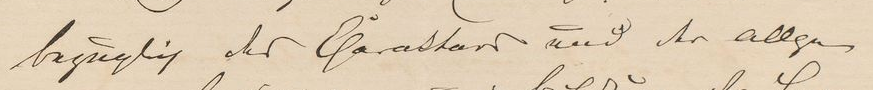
Bezüglich des Charakters und der allge-
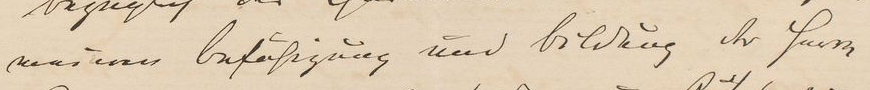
meinen Befähigung und Bildung des Herrn
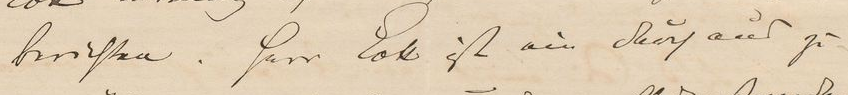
berichten. Herr Lott ist ein durchaus zu-
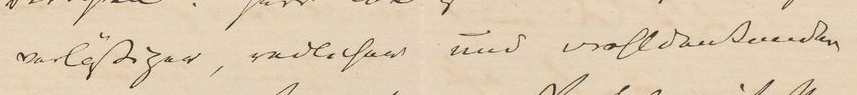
verläßiger, redlicher und wohldenkender
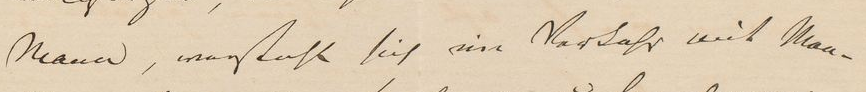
Mann, versteht sich im Verkehr mit Men-
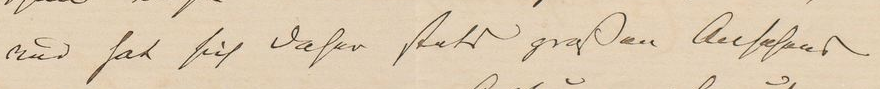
und hat sich daher stets großen Ansehens
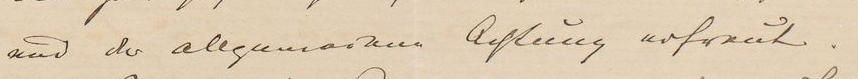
und der allgemeinen Achtung erfreut.
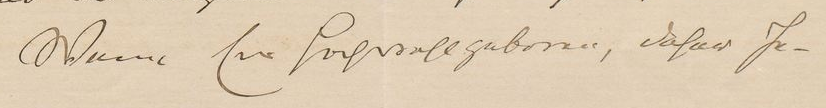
Wenn Ew Hochwohlgeboren, daher Je-
